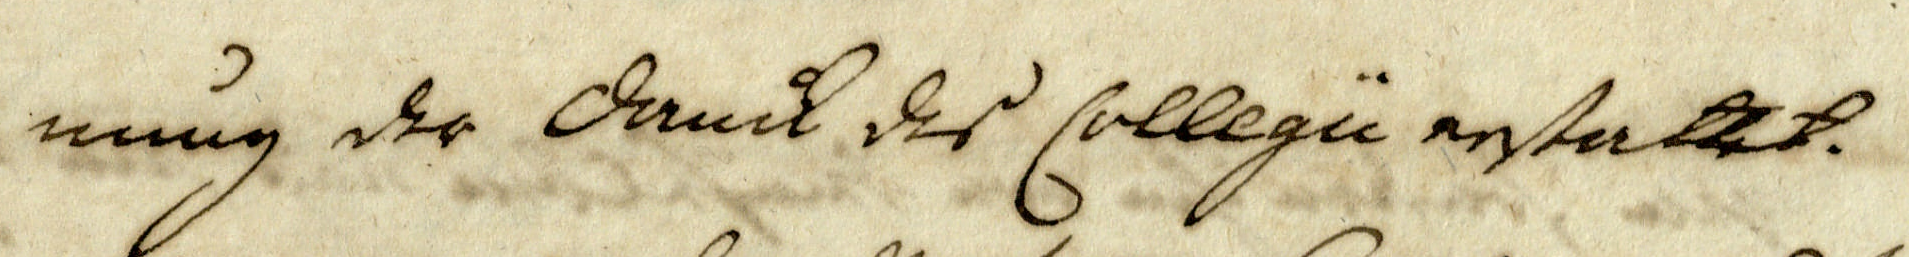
nung der Danck des Collegii erstattet.
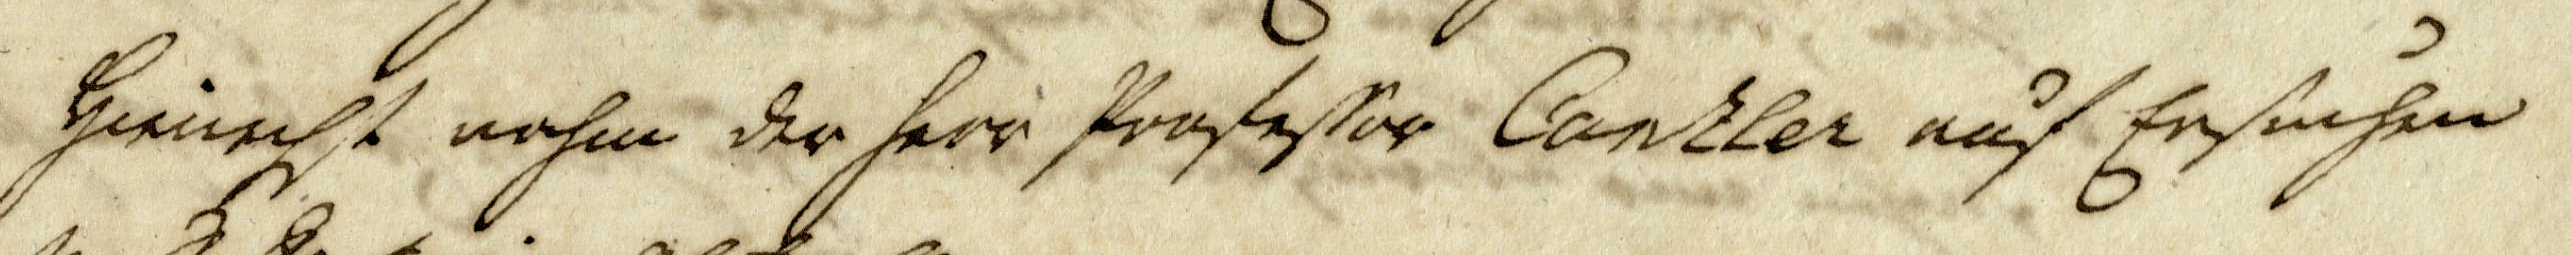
Hienechst nahm der Herr Professor Canzler auf Ersuchen
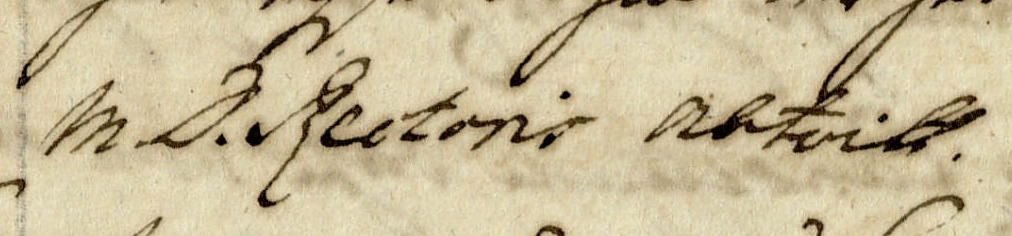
M. D. Rectoris Abtritt.
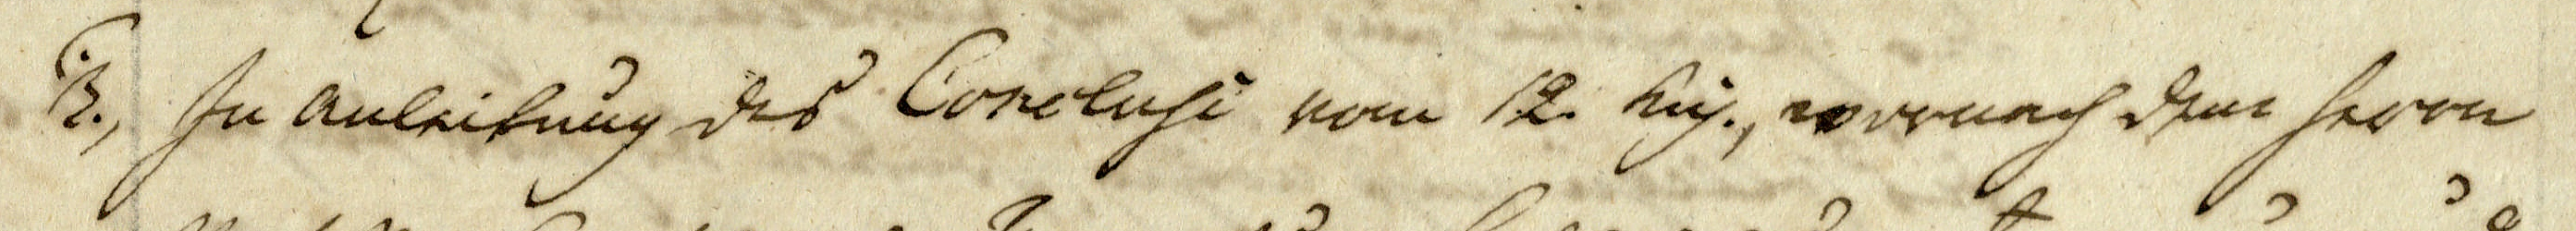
3., In Anleitung des Conclusi vom 12. huj., wornach dem Herrn
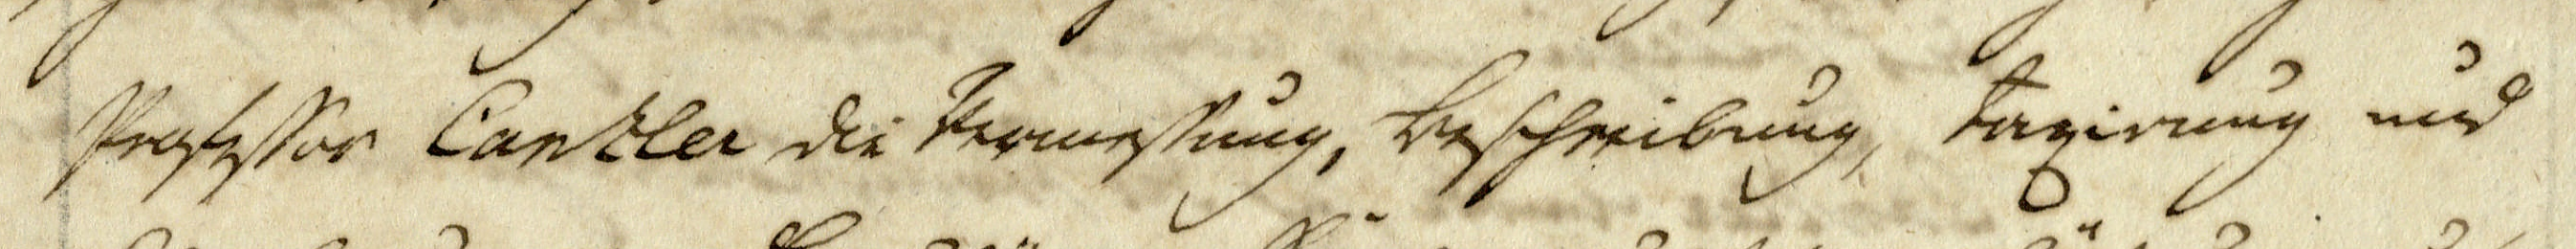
Professor Canzler die Vermessung, Beschreibung, Taxirung und
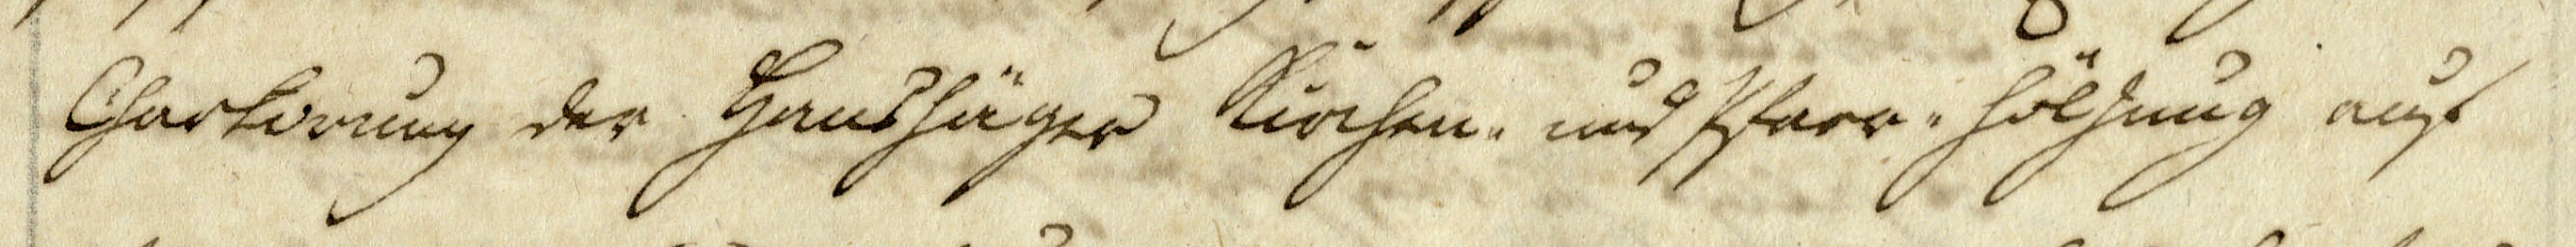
Chartirung der Hanshäger Kirchen- und Pfarr- Hölzung auf
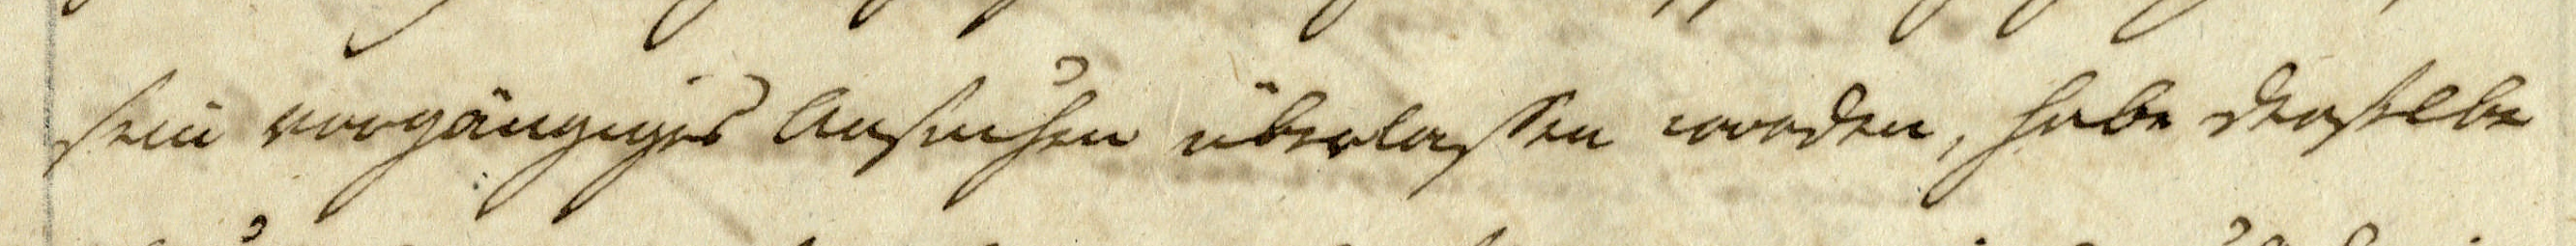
sein vorgängiges Ansuchen überlassen worden, habe derselbe
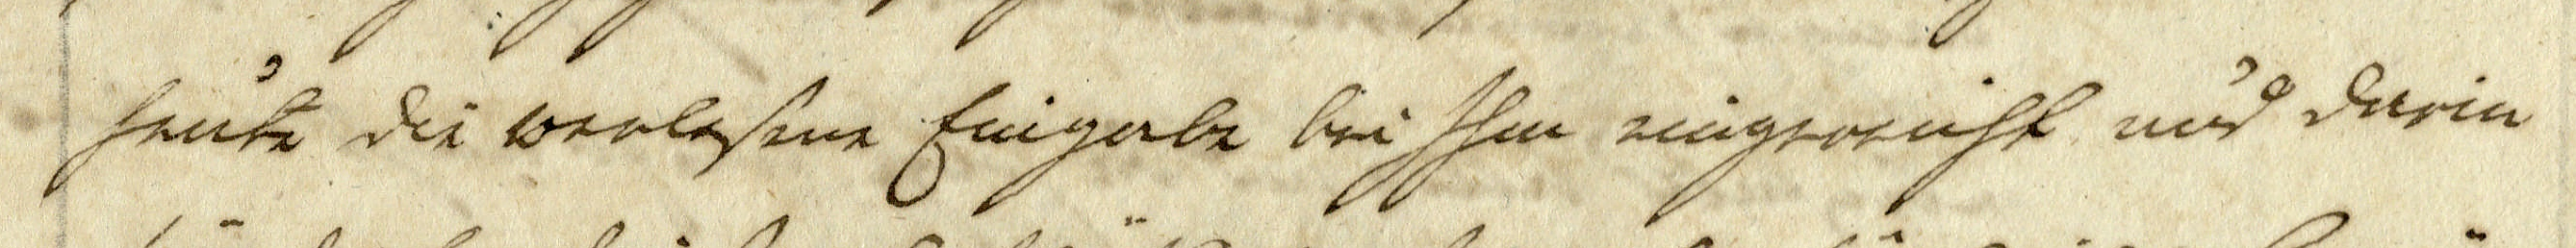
heute die verlesene Eingabe bei Ihm eingereicht und darin
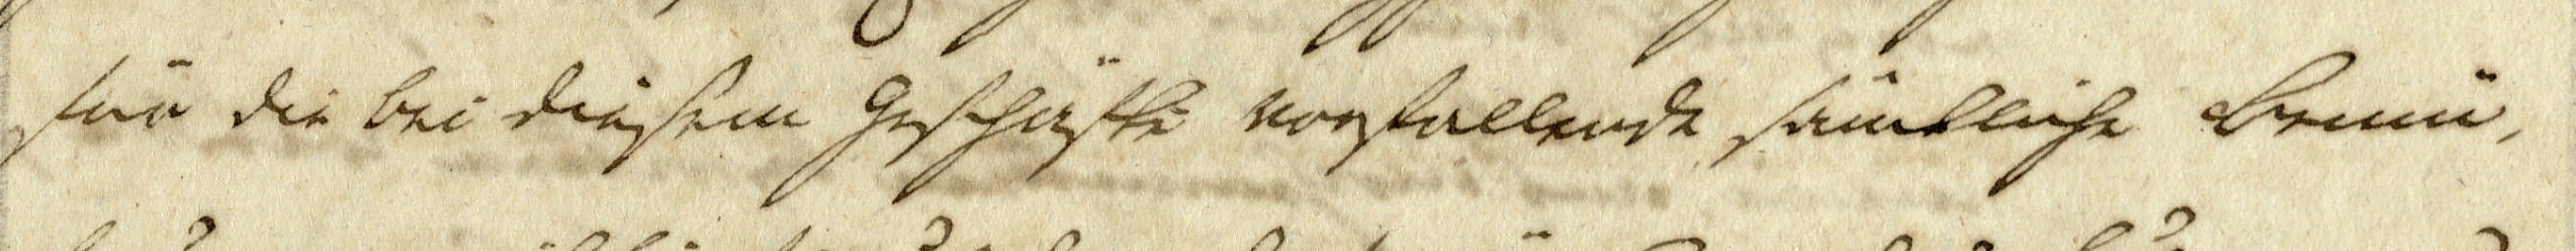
für die bei diesem Geschäfte vorfallende sämtliche Bemü¬
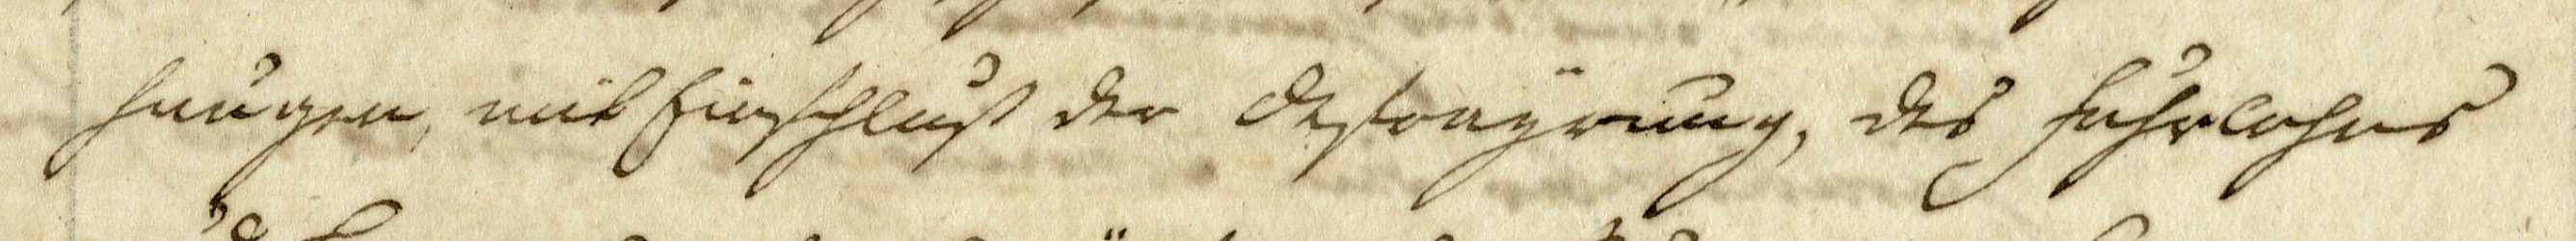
hungen mit Einschluß den Defraÿrung, des Fuhrlohns
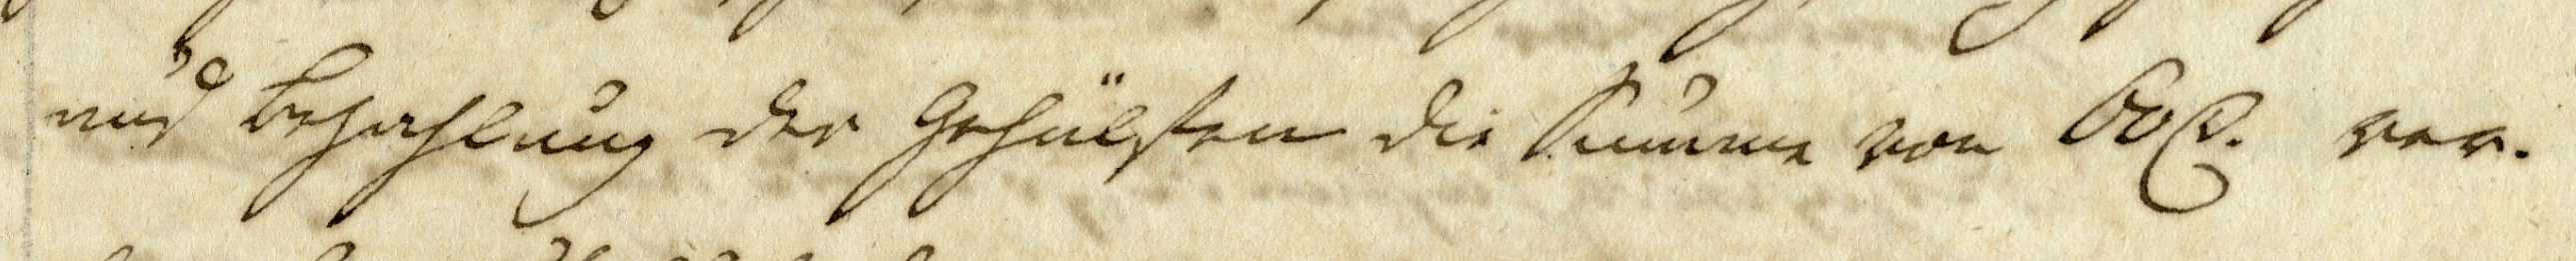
und Bezahlung der Gehülfen die Summe von 60 l. ver¬
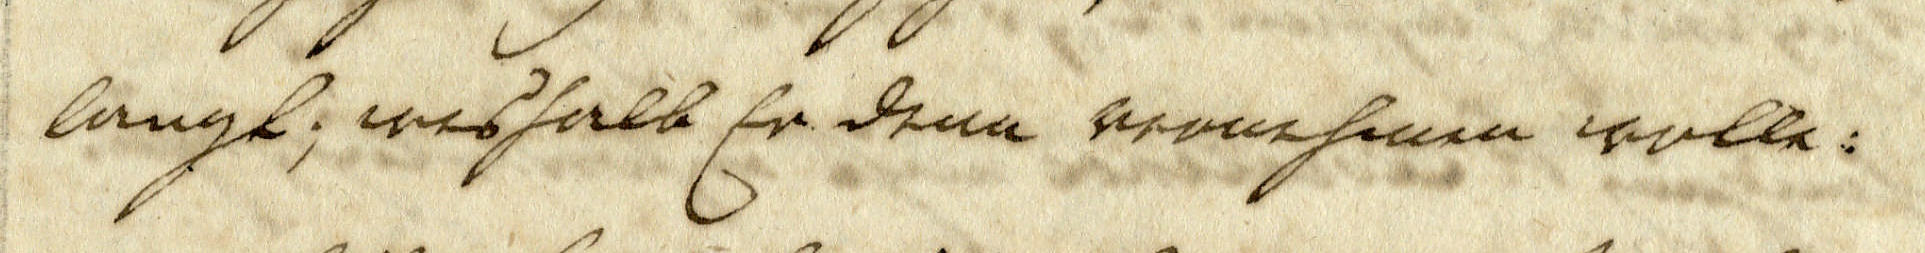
langt; weshalb Er denn vernehmen wolle:
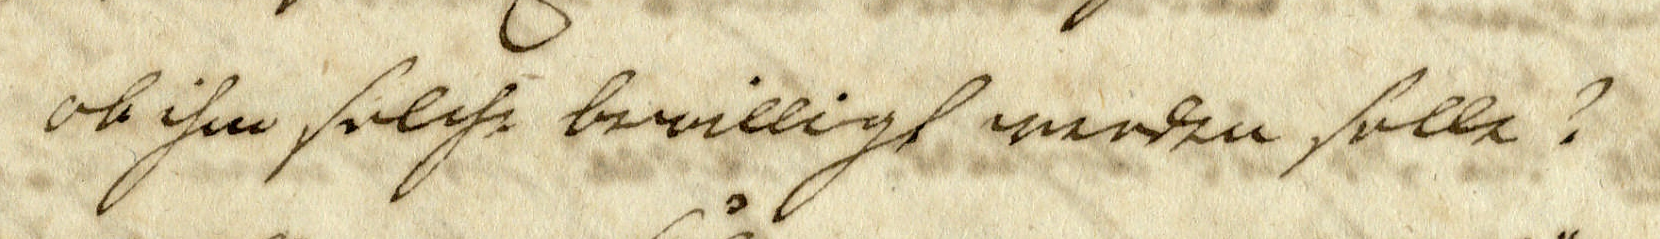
ob ihm solche bewilligt werden solle?
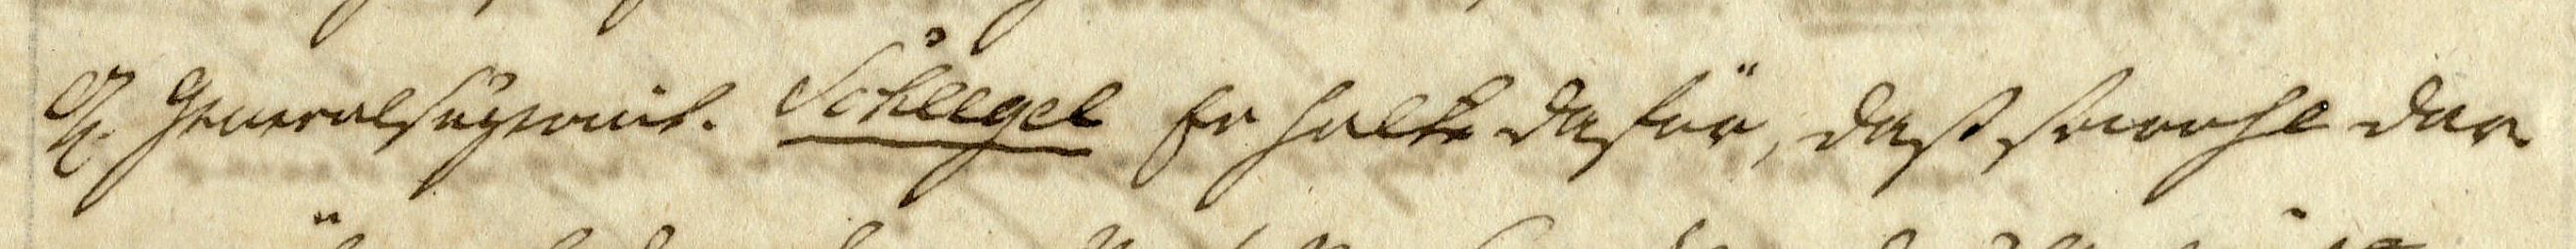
dh. Generalsuperint. Schlegel Er halte dafür, daß sowohl dar¬
